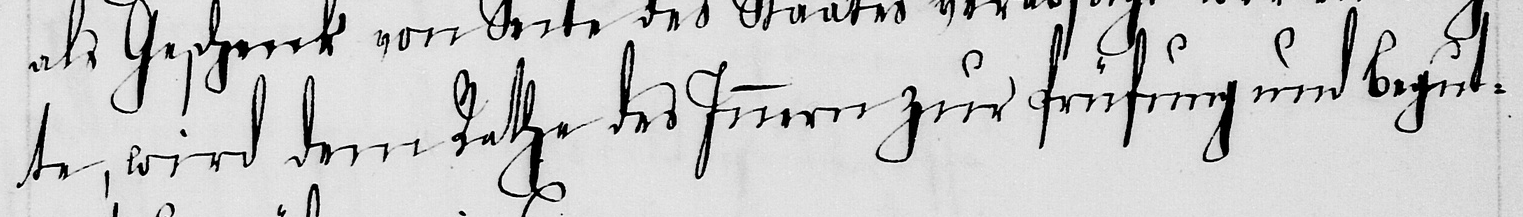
te, wird dem Rathe des Innern zur Prüfung und Begut¬
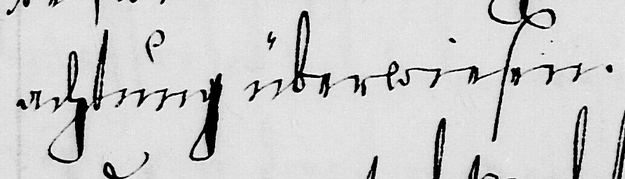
achtung überwiesen.
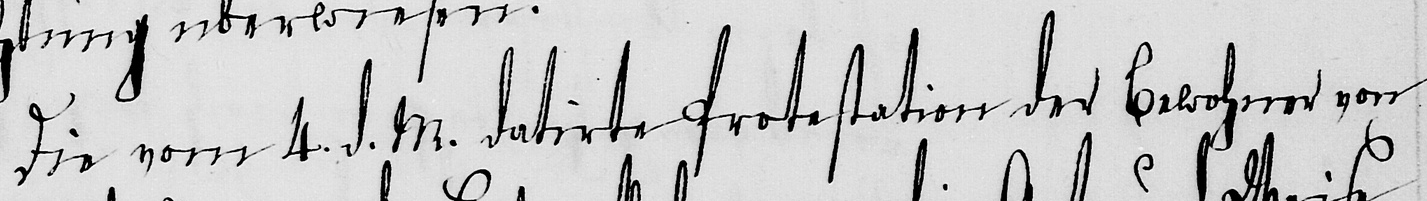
Die vom 4. d. M. datirte Protestation der Bewohner von
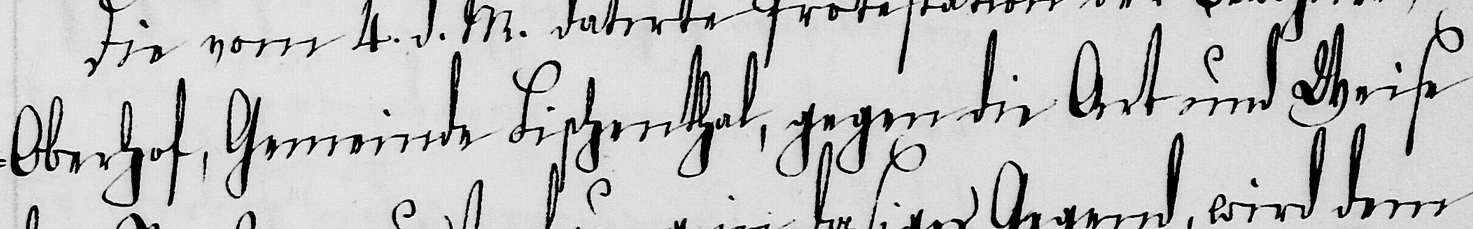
Oberhof, Gemeinde Fischenthal, gegen die Art und Weise
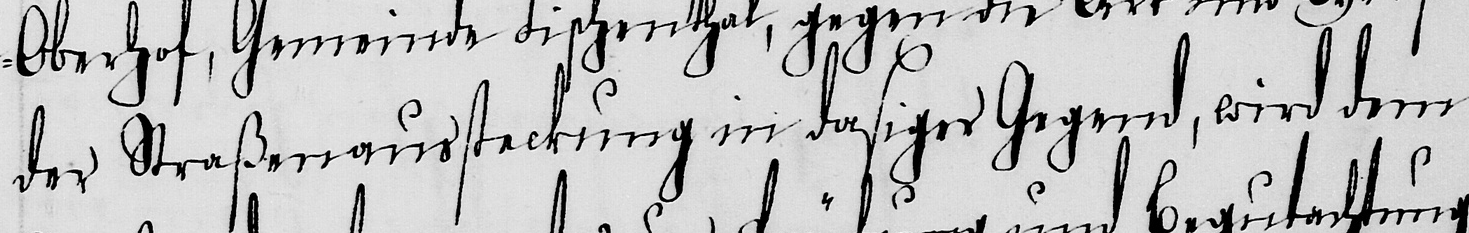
der Straßenaussteckung in dasiger Gegend, wird dem
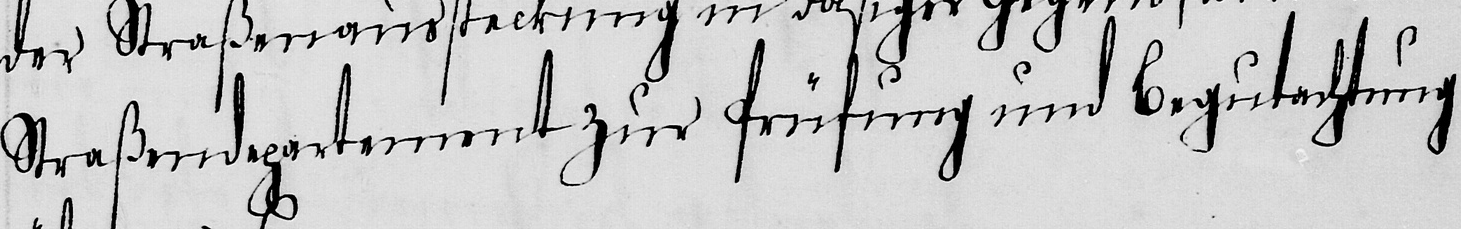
Straßendepartement zur Prüfung und Begutachtung
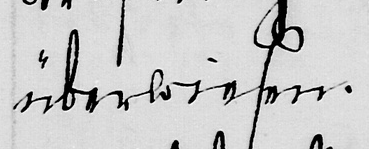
überwiesen.
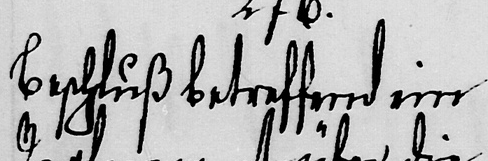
behandelt zu werden,
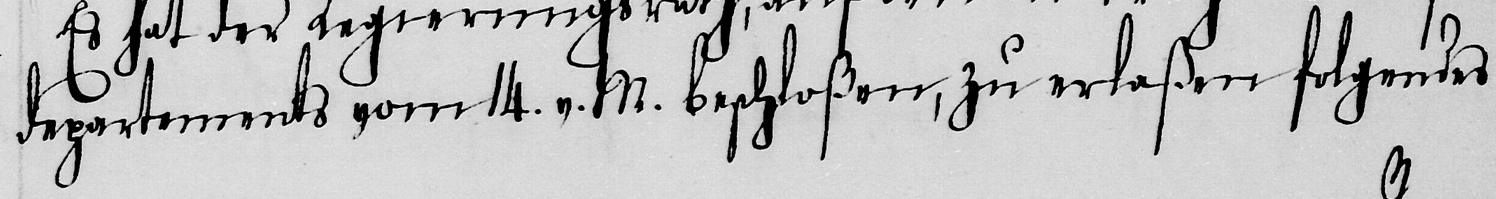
departements vom 14. v. M. beschloßen, zu erlaßen folgendes
